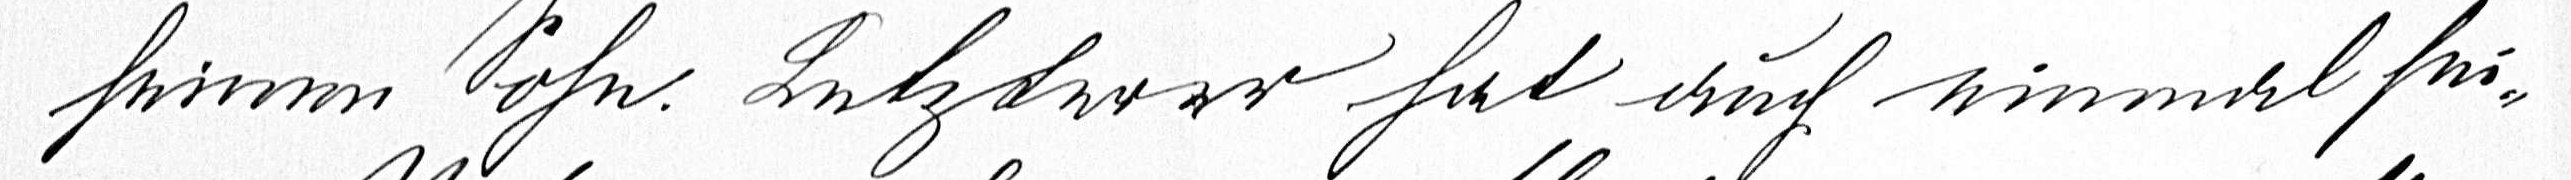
seinen Sohn. Letzterer hat auch einmal sei¬
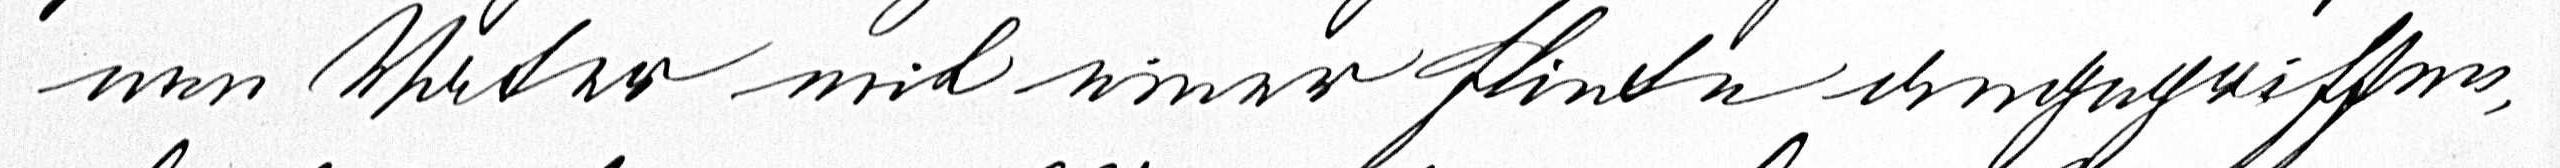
nen Vater mit einer Flinte angegriffen,
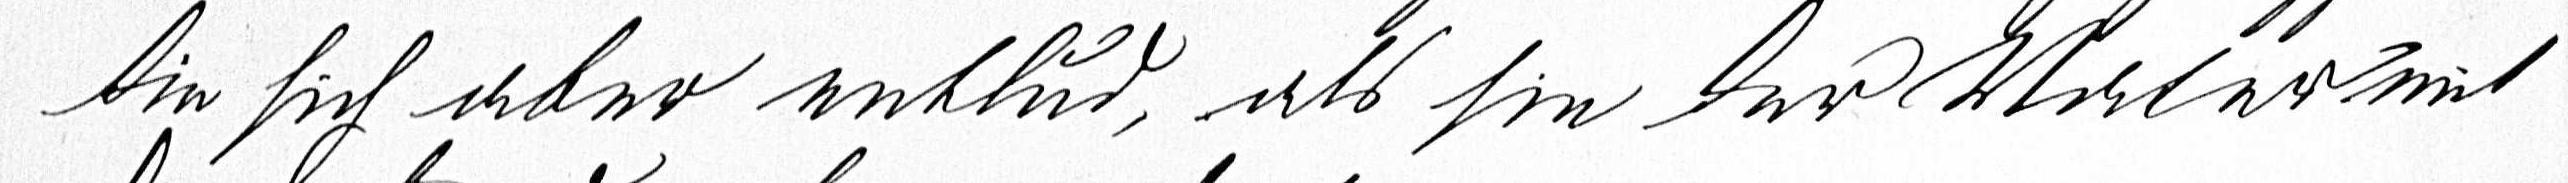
die sich aber entlud, als sie der Vater mit
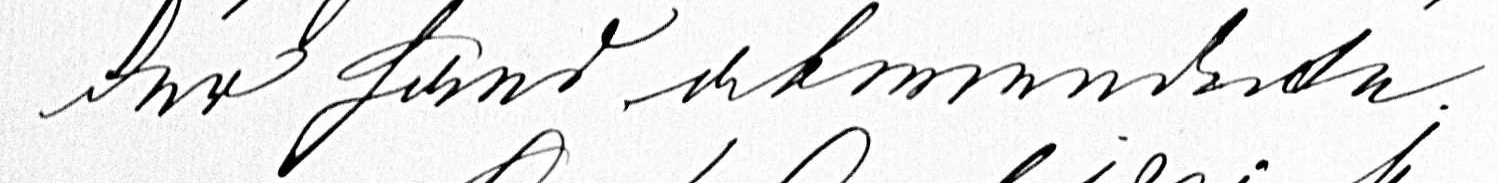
der Hand abwendete.
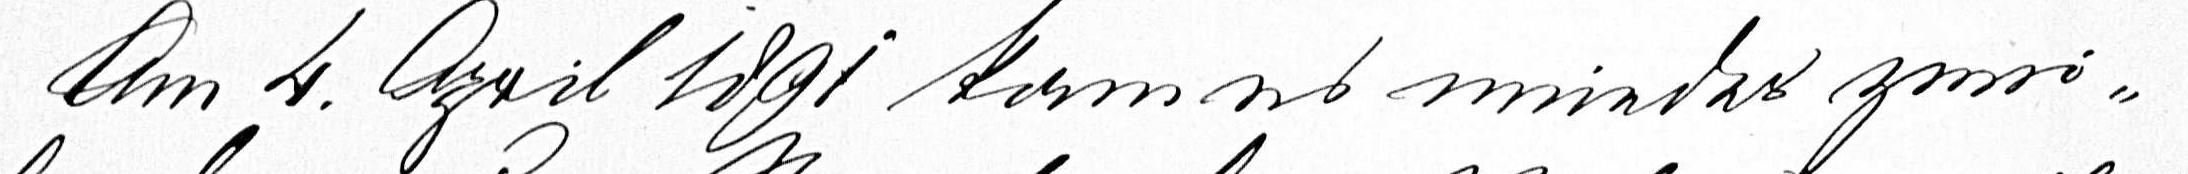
Am 4. April 1891 kam es wieder zwi¬
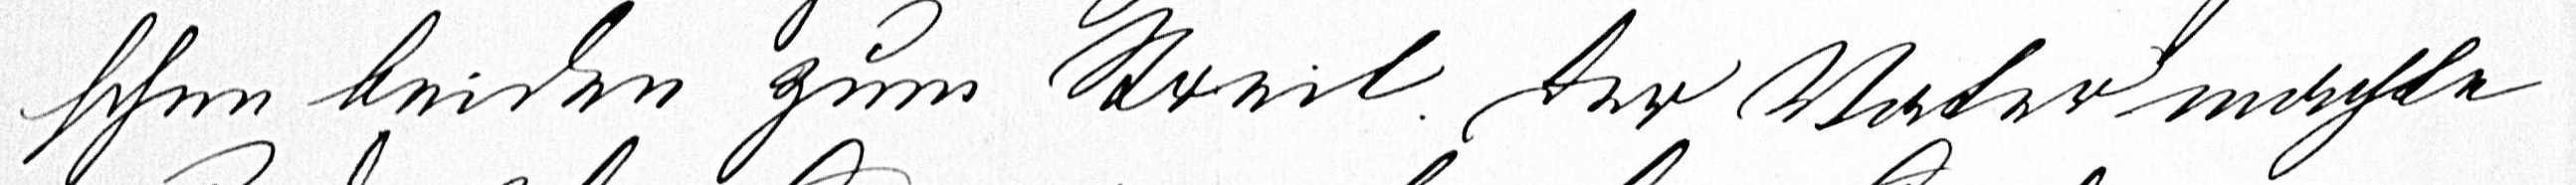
schen beiden zum Streit. Der Vater machte
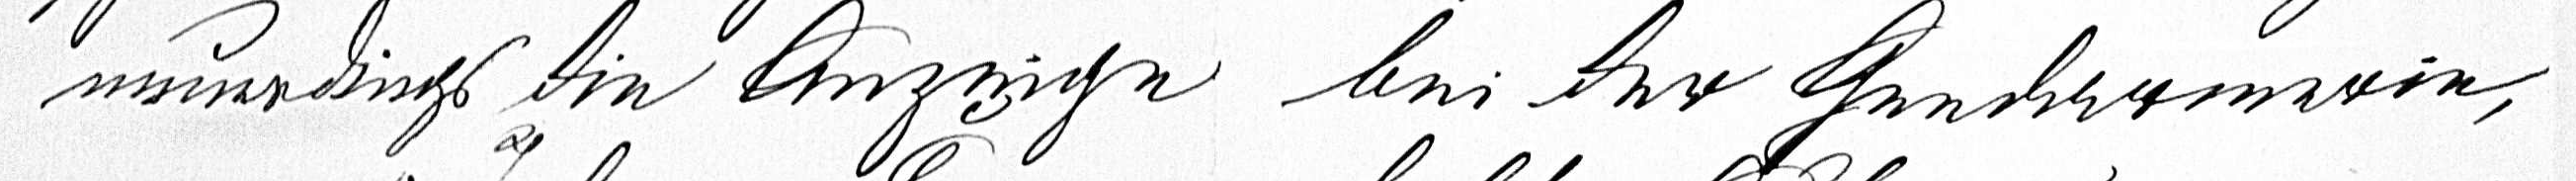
neuerdings die Anzeige bei der Gendarmerie,
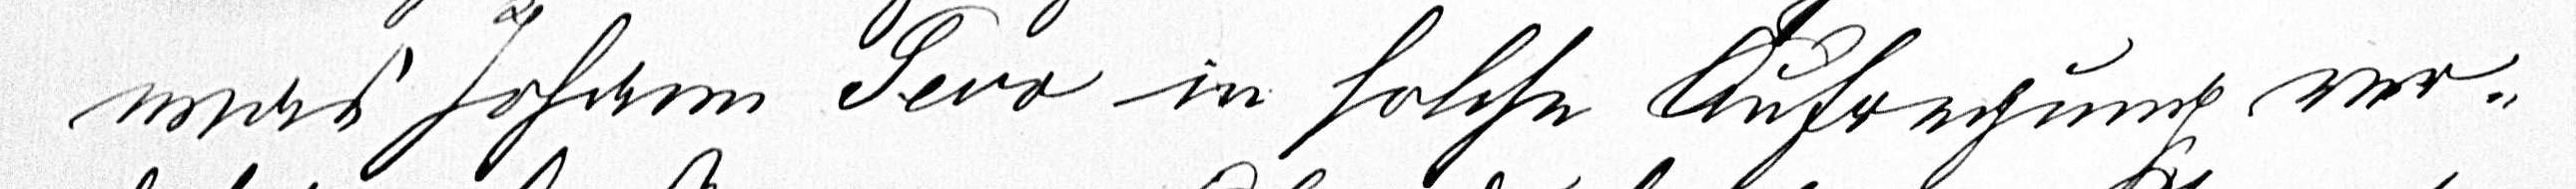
was Johann Ševo in solche Aufregung ver¬
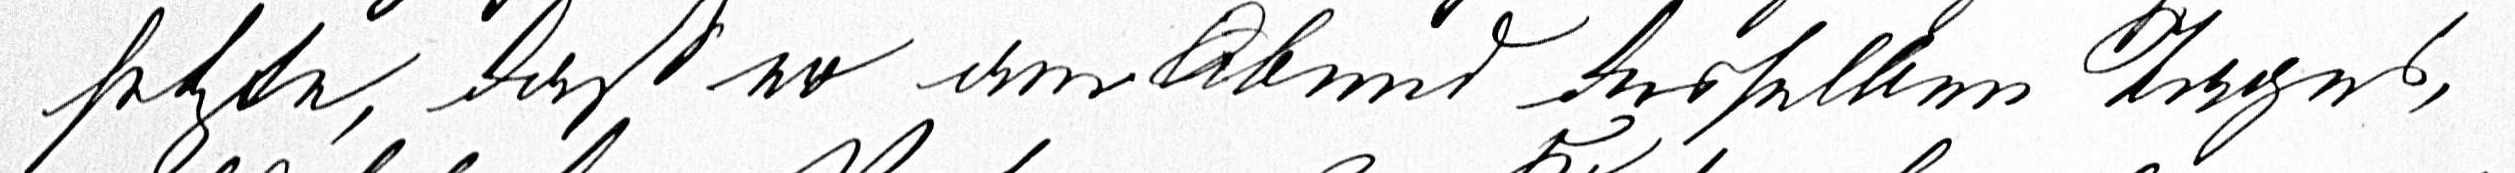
setzte, daß er am Abend desselben Tages,
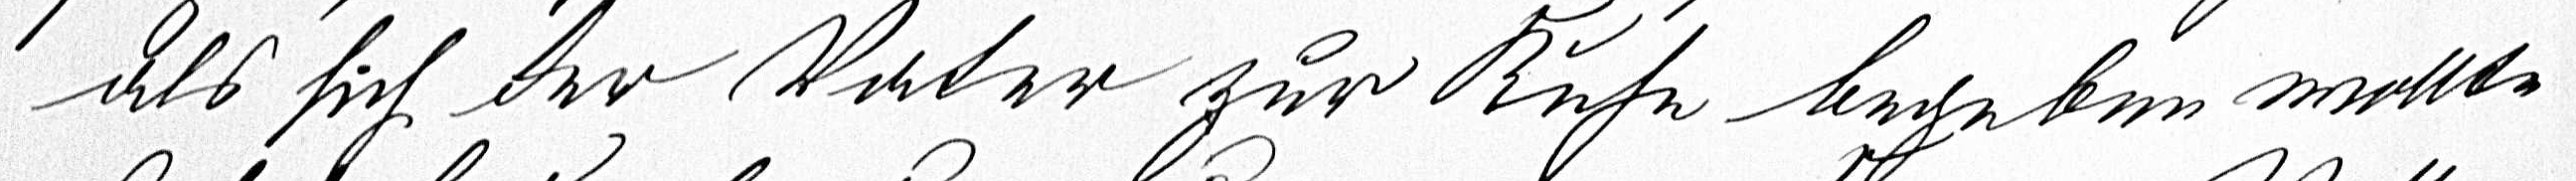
als sich der Vater zur Ruhe begaben wollte
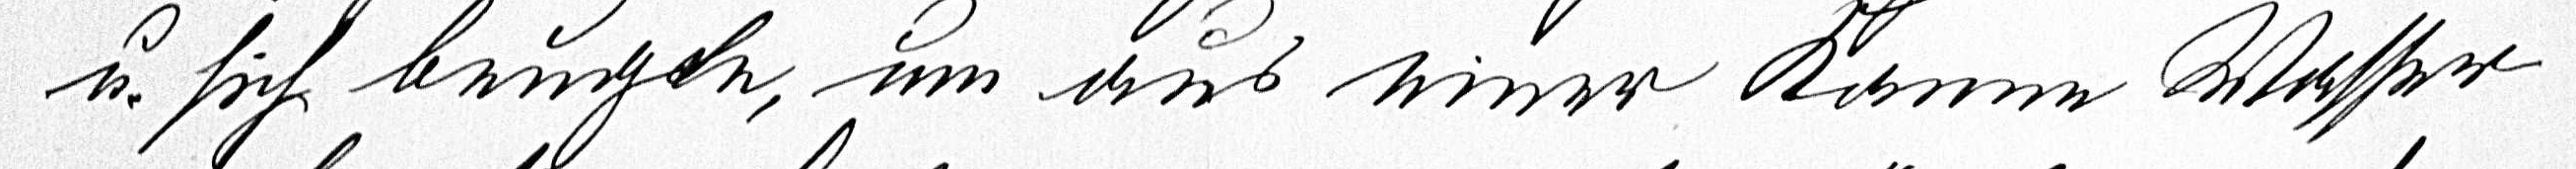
u sich beugte, um aus einer Kanne Wasser
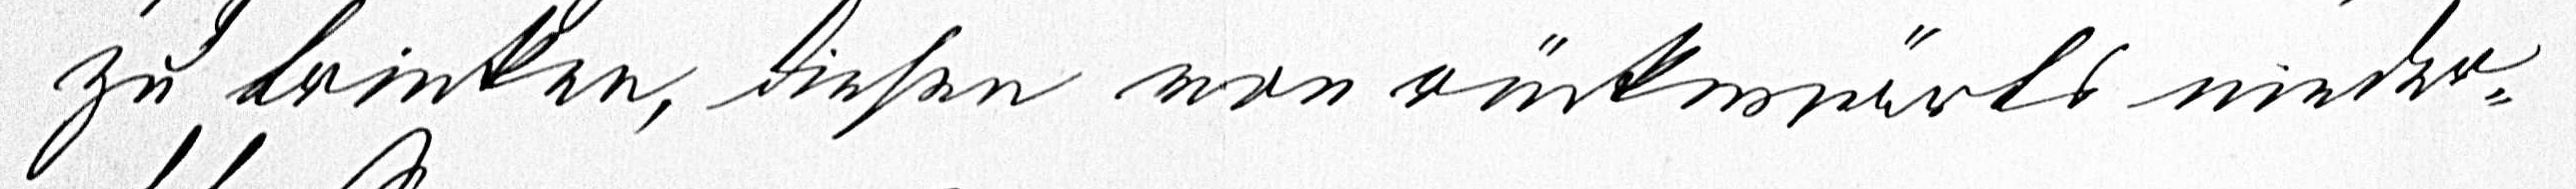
zu trinken, diesen von rückwärts nieder¬
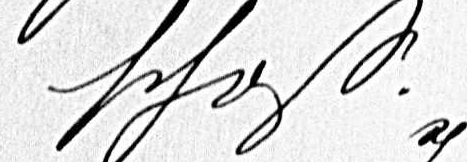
schoß.
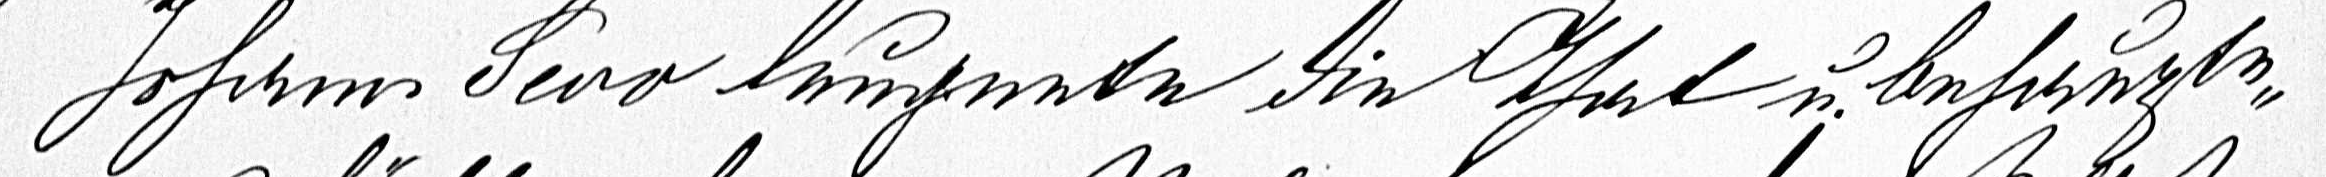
Johann Ševo leugnete die That u. behaup¬
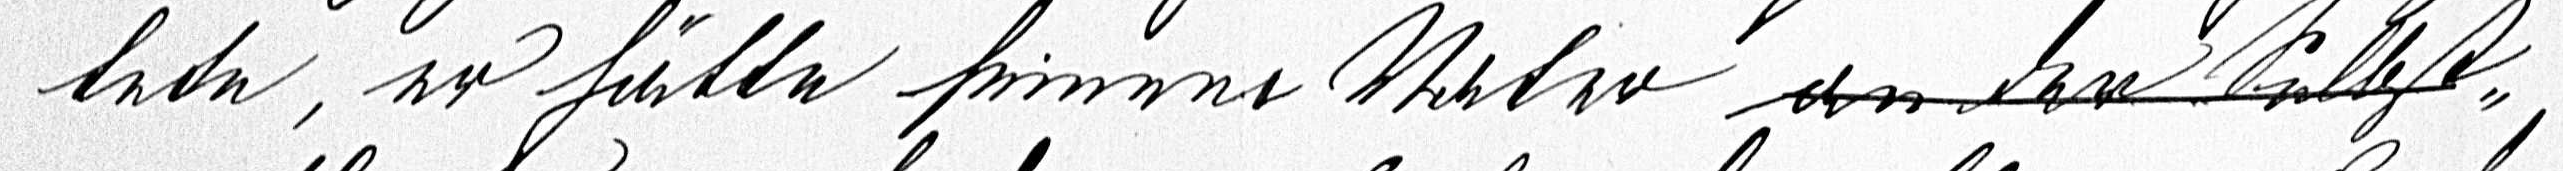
tete, er hätte seines Vater an der Selbst¬
